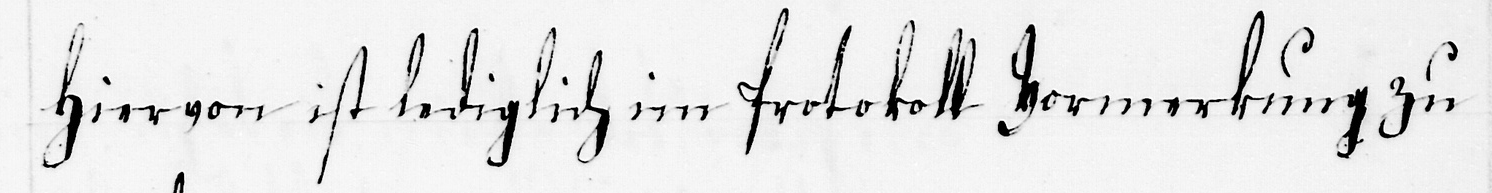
Hiervon ist lediglich im Protokoll Vormerkung zu
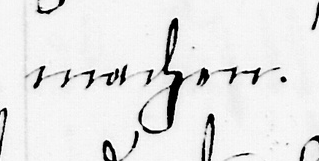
machen.
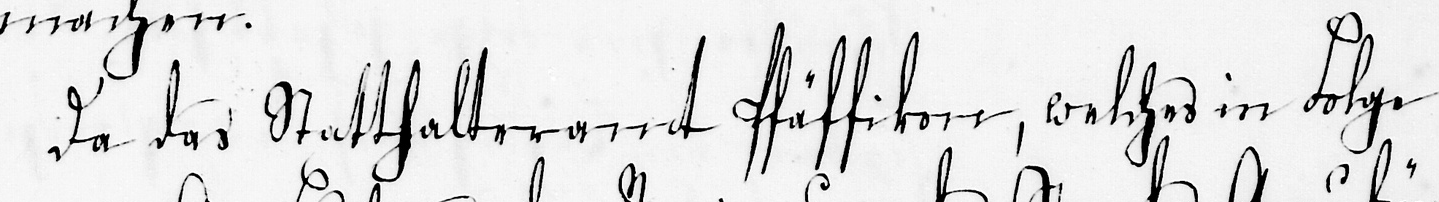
Da das Statthalteramte Pfäffikon, welches in Folge
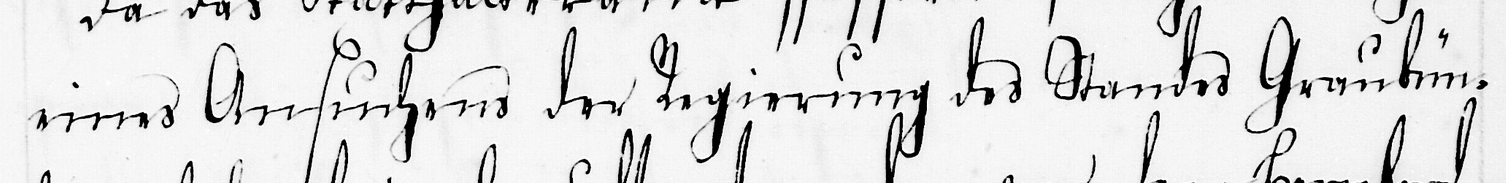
eines Ansuchens der Regierung des Standes Graubün¬
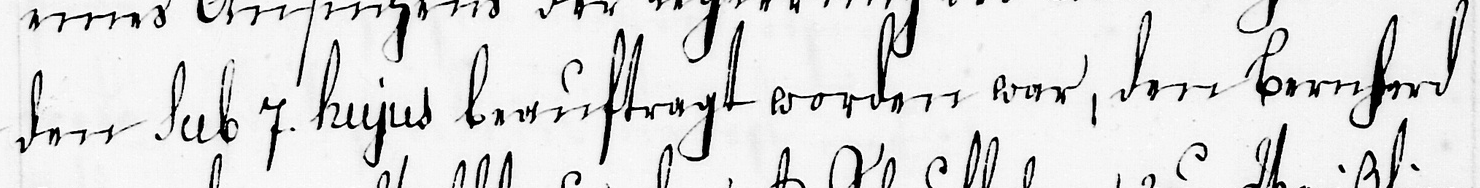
den sub 7. hujus beauftragt worden war, den Bernhard
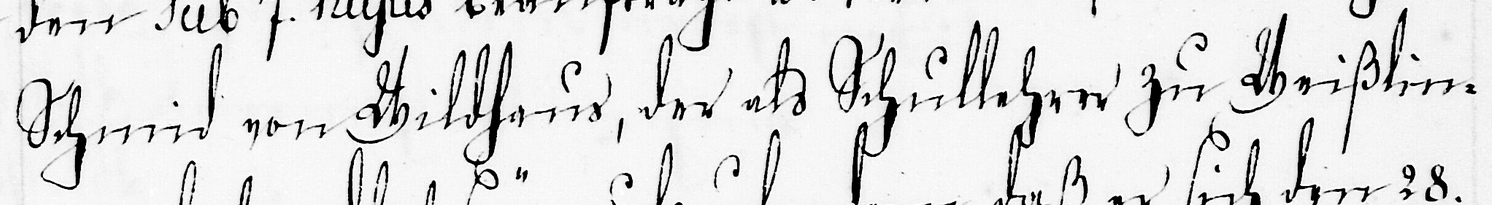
Schmid von Wildhaus, der als Schullehrer zu Weißlin¬
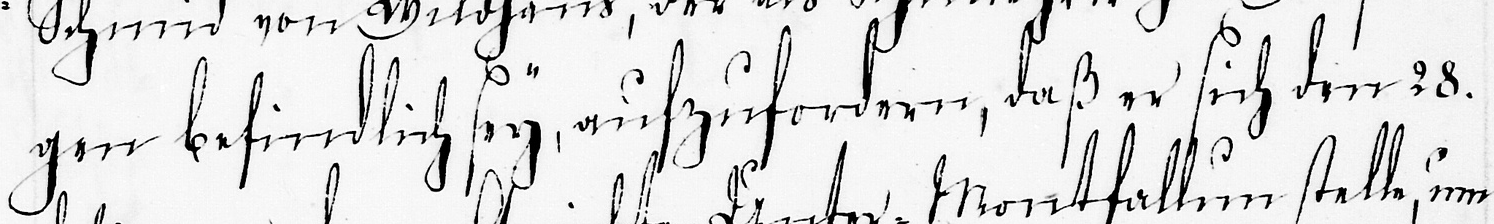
gen befindlich sey, aufzufordern, daß er sich den 28.
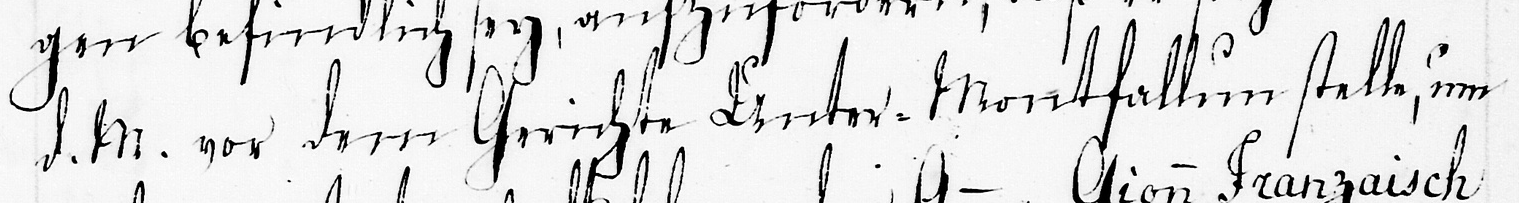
d. M. vor dem Gerichte Unter-Montfallum stelle, um
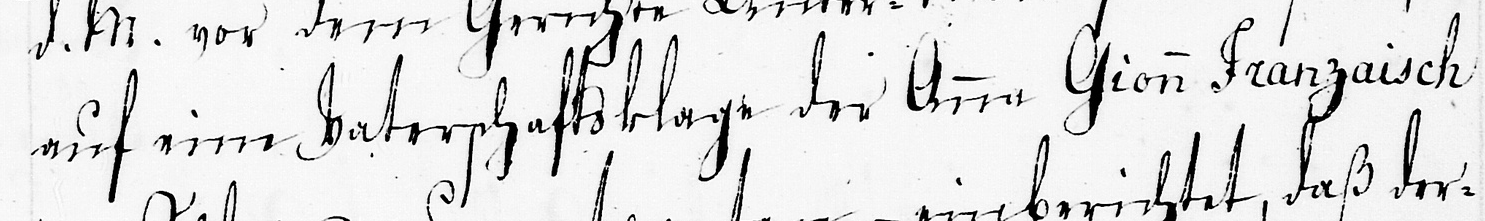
auf eine Vaterschaftsklage der Anna Gionn Franzaisch
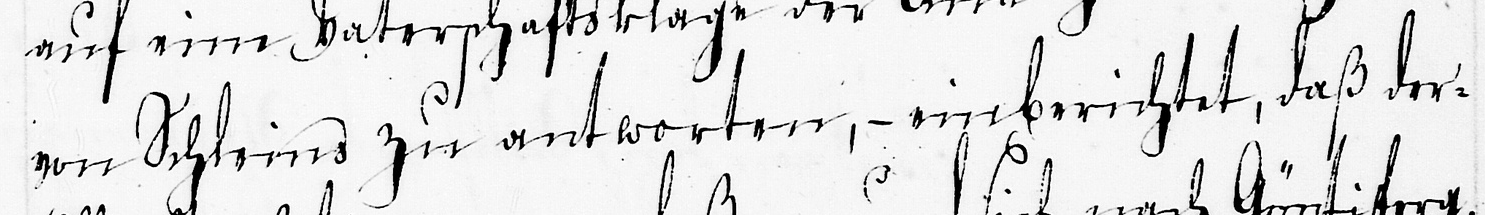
von Schleins zu antworten, – einberichtet, daß der¬
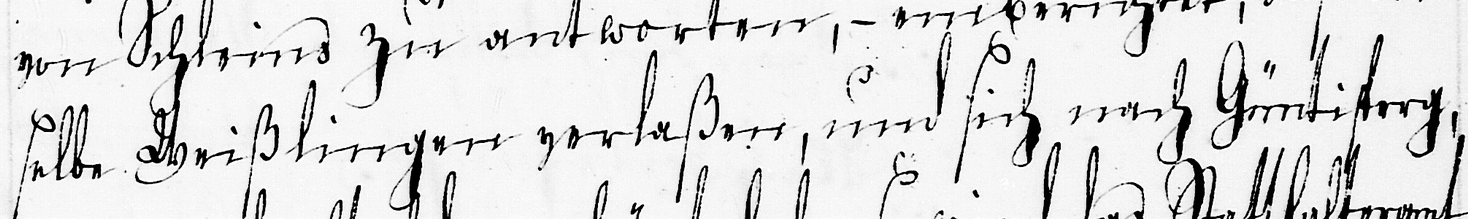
selbe Weißlingen verlaßen, und sich nach Güntisperg,
